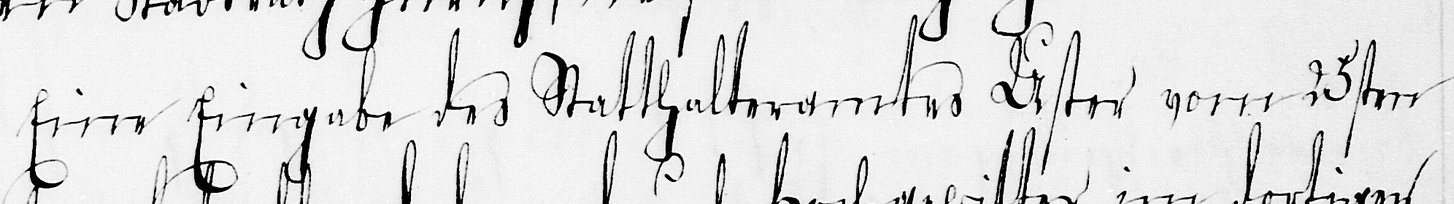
Eine Eingabe des Statthalteramtes Uster vom 25sten
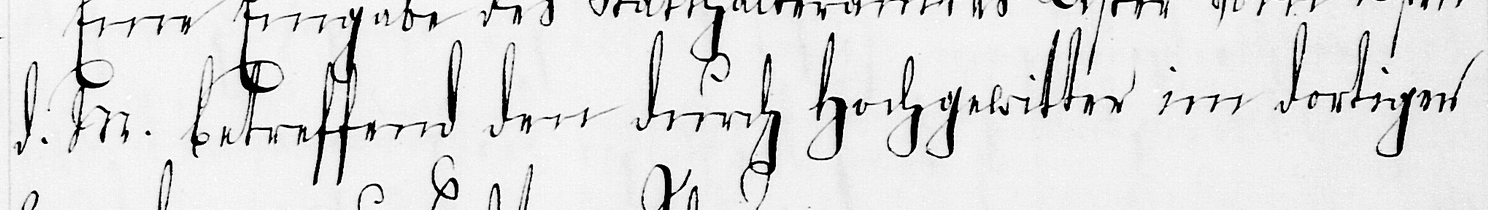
d. M. betreffend den durch Hochgewitter im dortigen
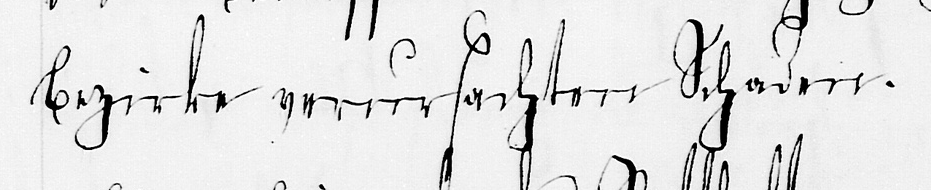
Bezirke verursachten Schaden.
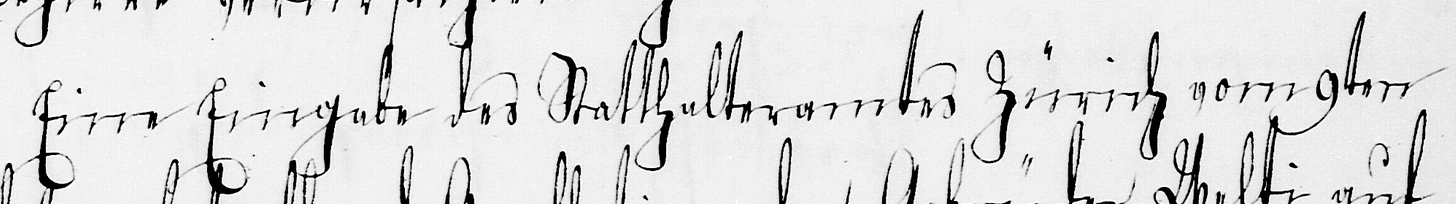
Eine Eingabe des Statthalteramtes Zürich vom 9ten
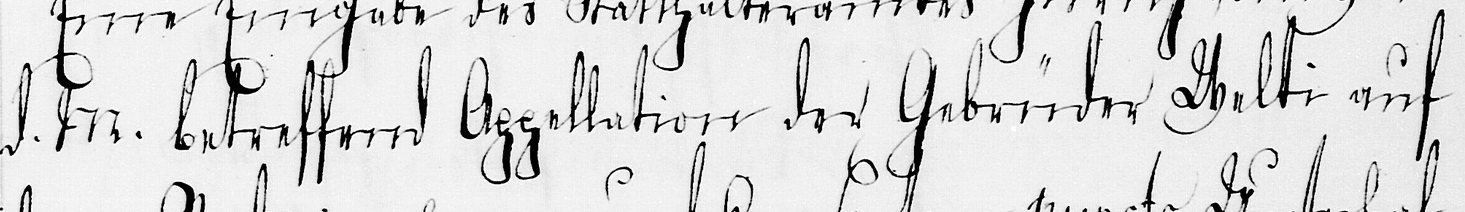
d. M. betreffend Appellation der Gebrüder Welti auf
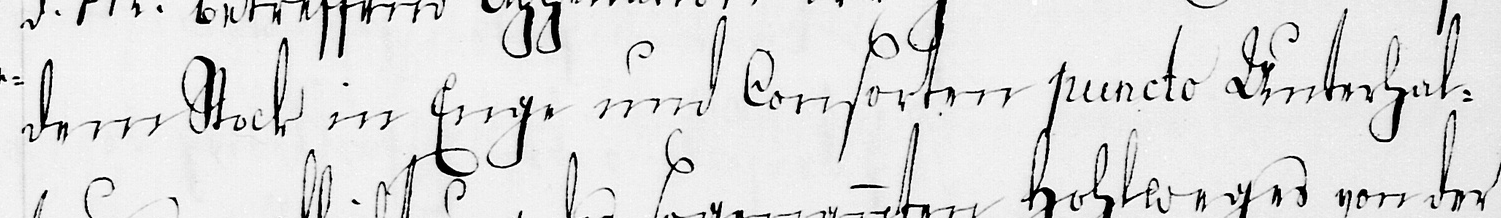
dem Stock in Enge und Consorten puncto Unterhal¬
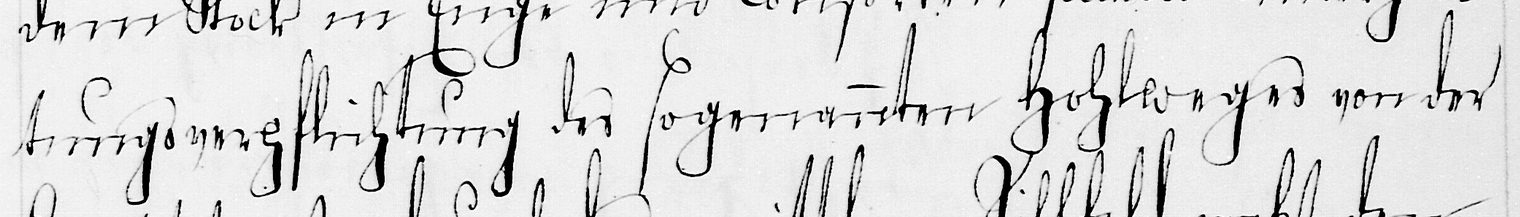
tungsverpflichtung des sogenannten Hohlweges von der
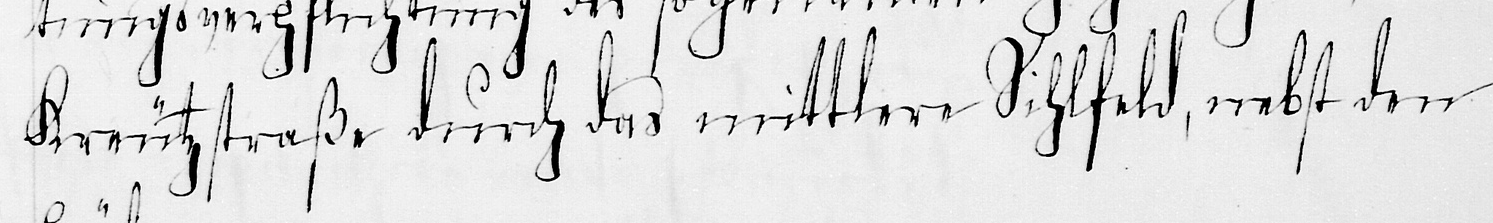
Kreutzstraße durch das mittlere Sihlfeld, nebst den
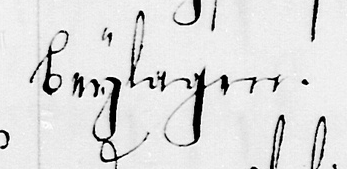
Beylagen.
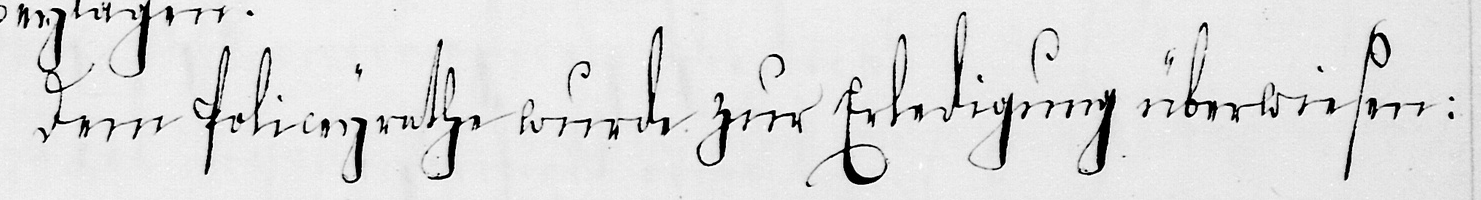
Dem Policeyrathe wurde zur Erledigung überwiesen:
